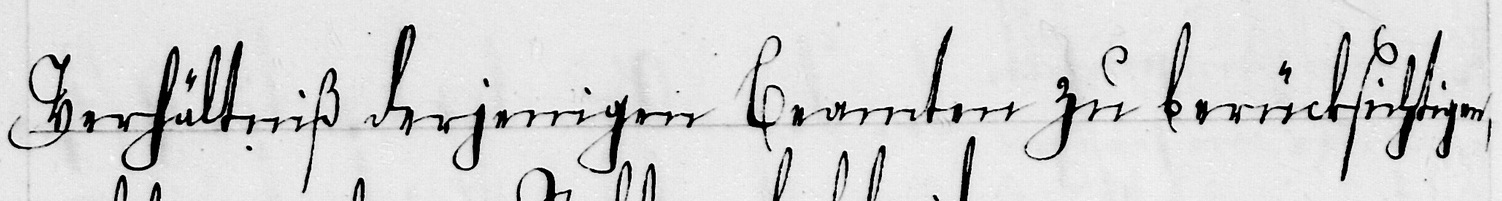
Verhältniß derjenigen Beamten zu berücksichti¬
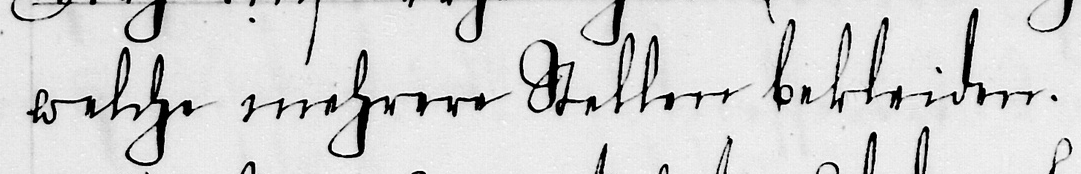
welche mehrere Stellen bekleiden.
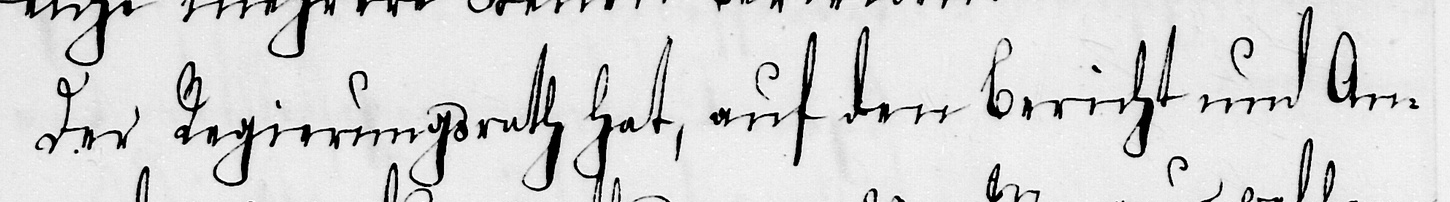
Der Regierungsrath hat, auf den Bericht und An¬
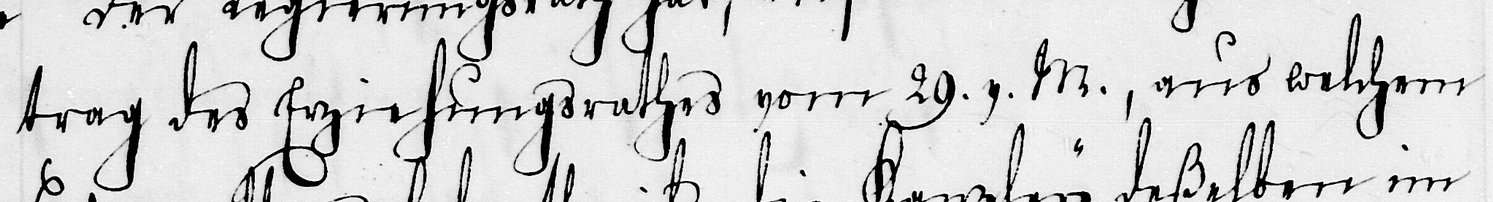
trag des Erziehungsrathes vom 29. v. M., aus welchem
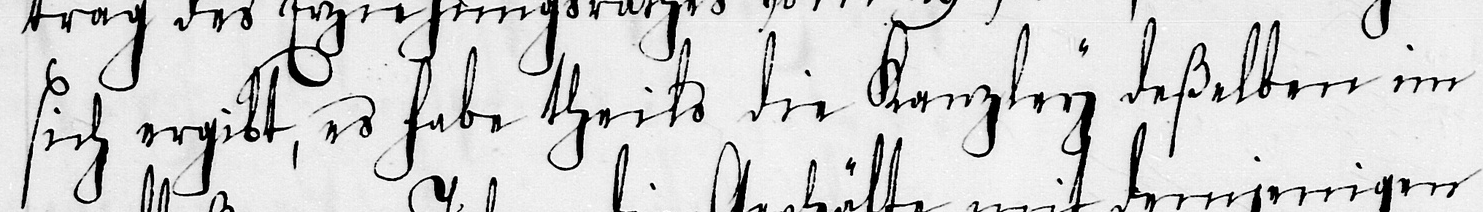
sich ergibt, es habe theils die Kanzley deßelben im
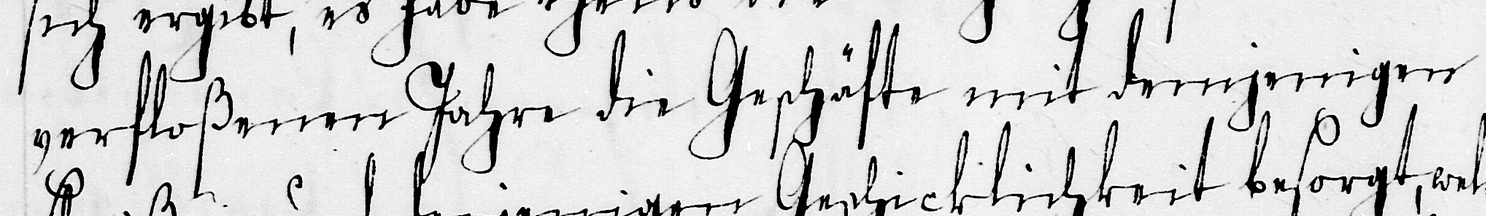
verfloßenen Jahre die Geschäft mit demjenigen
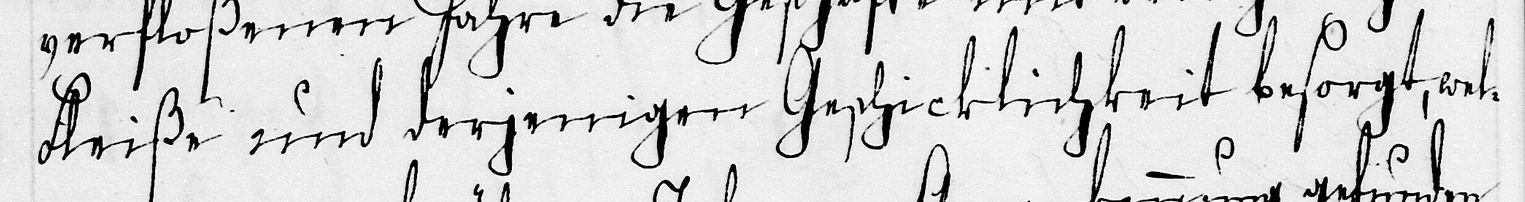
Fleiße und derjenigen Geschicklichkeit besorgt, wel¬
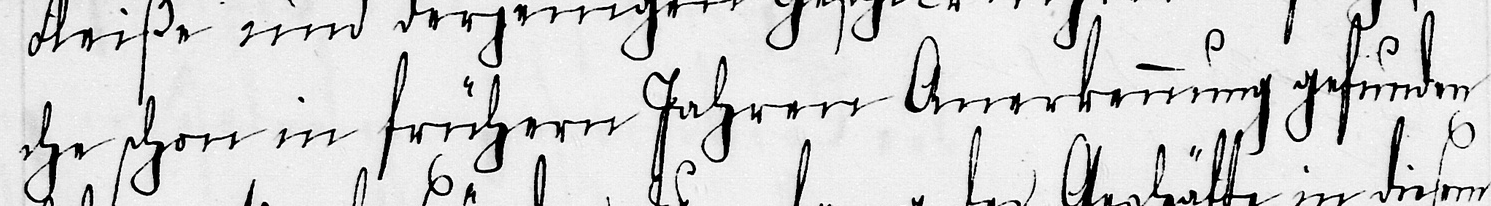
che schon in frühern Jahren Anerkennung gefunden
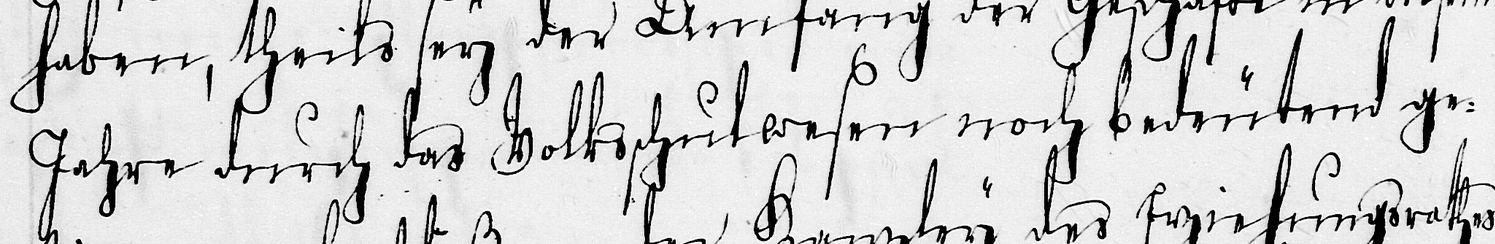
Jahre durch das Volksschulwesen noch bedeutend ge¬
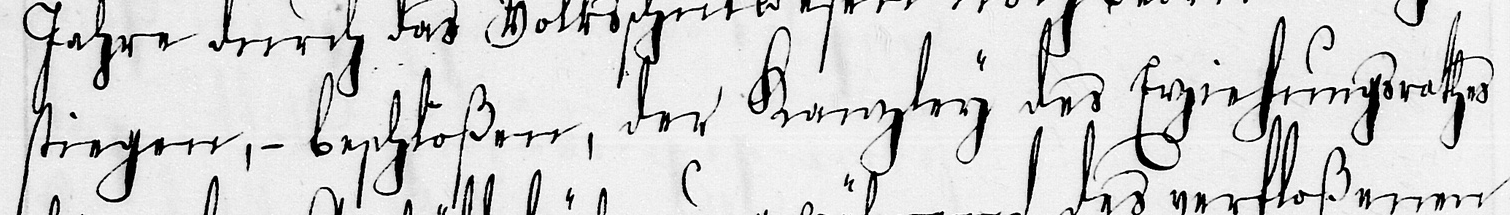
stiegen, – beschloßen, der Kanzley des Erziehungsrathes
